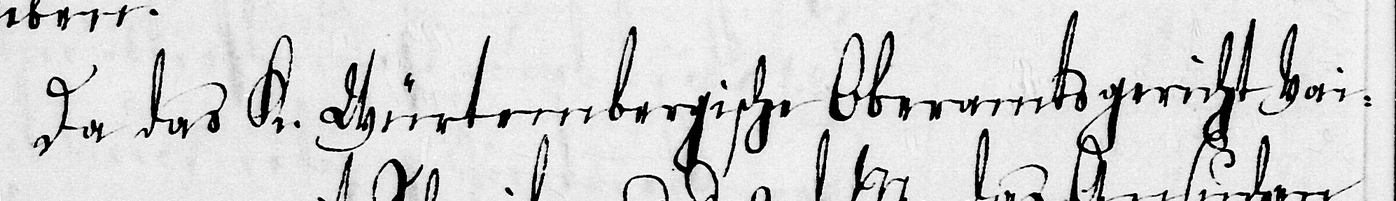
Da das K. Würtembergische Oberamtsgericht Vai¬
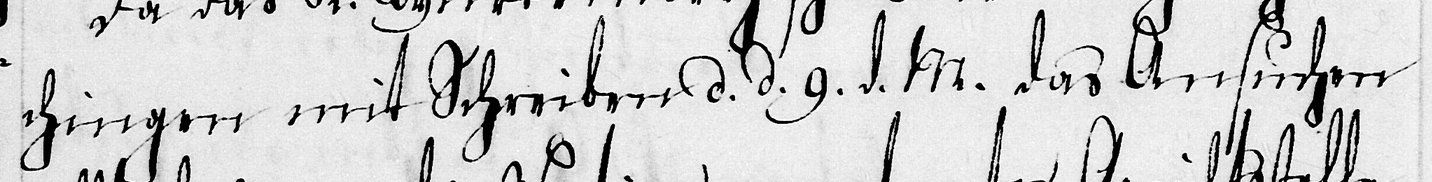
chingen mit Schreiben d. d. 9. d. M. das Ansuchen
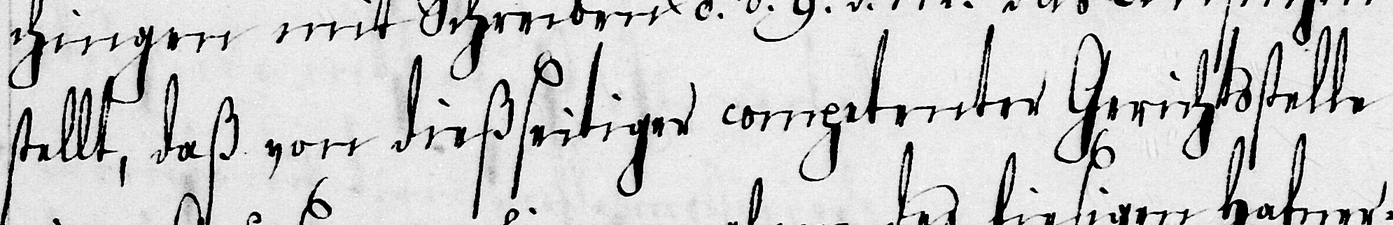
lt, daß von dießseitiger competenter Gerichtsstel¬
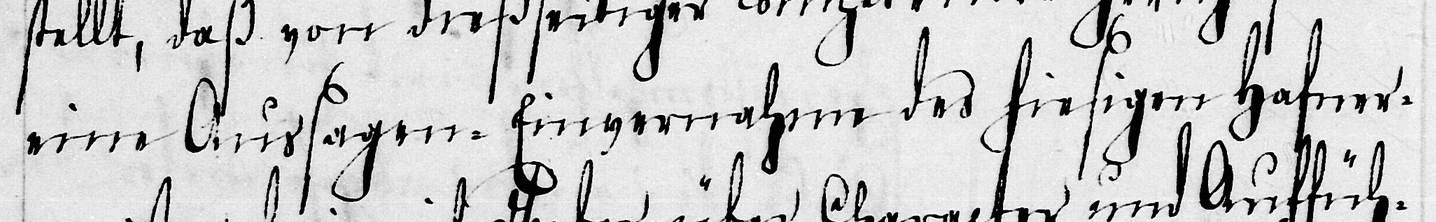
eine Aussagen-Einvernahme des hiesigen Hafner¬
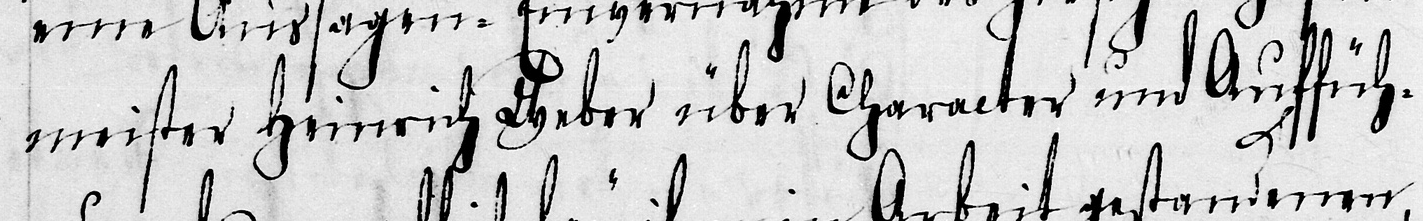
meister Heinrich Weber über Character und Auffüh¬
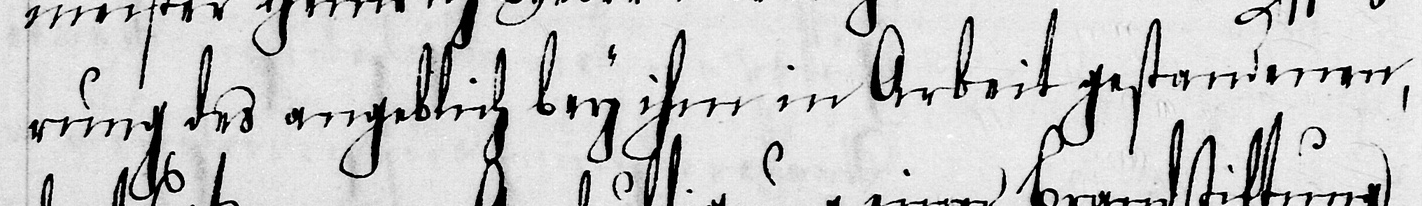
rung des angeblich bey ihm in Arbeit gestandenen,
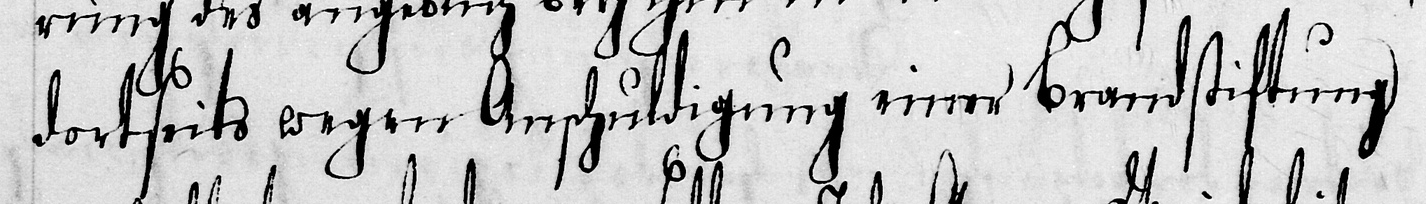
dortseits wegen Anschuldigung einer Brandstiftung
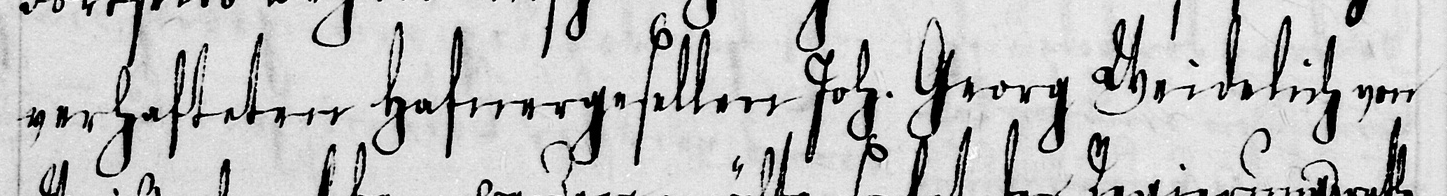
verhafteten Hafnergesellen Joh. Georg Weidelich von
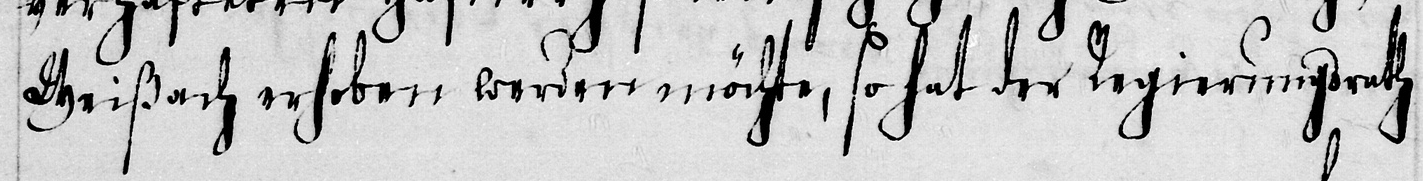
Weißach erhoben werden möchte, so hat der Regierungsrath
